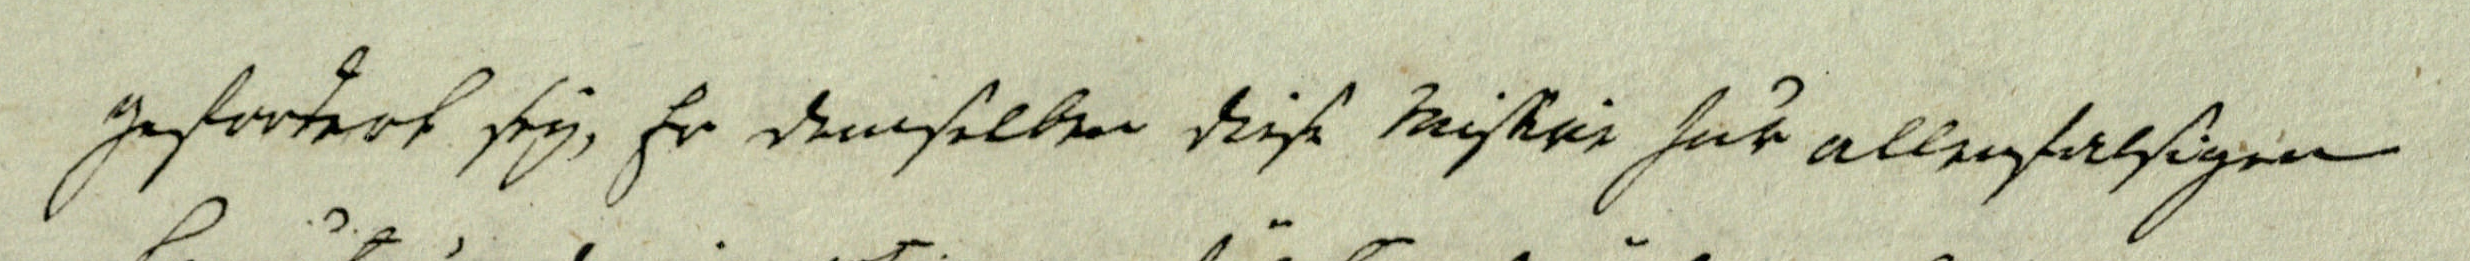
gefordert seÿ, Er demselben diese Missive zur allerfalsigen
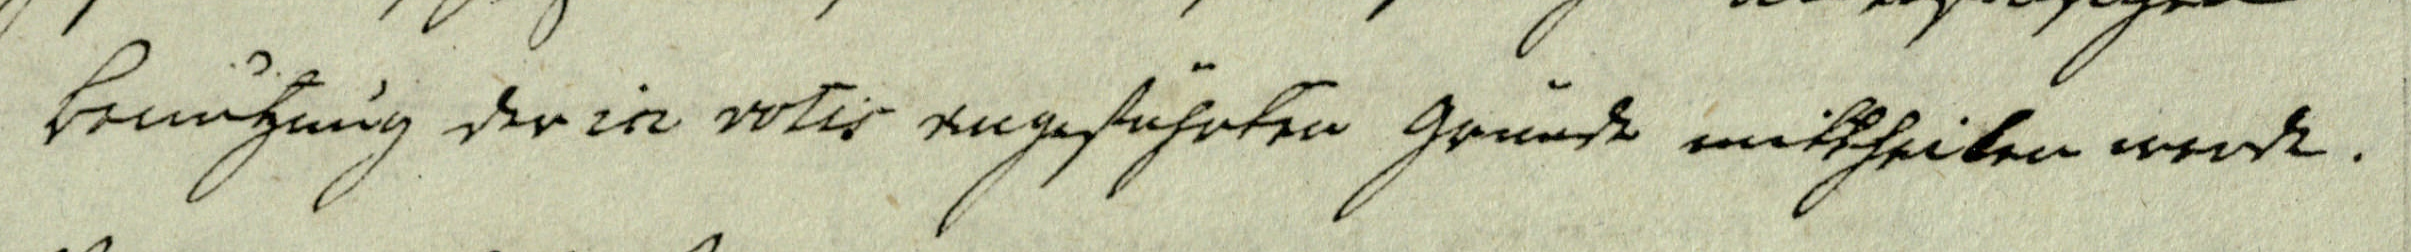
Benutzung der in votis angeführten Gründe mittheilen werde.
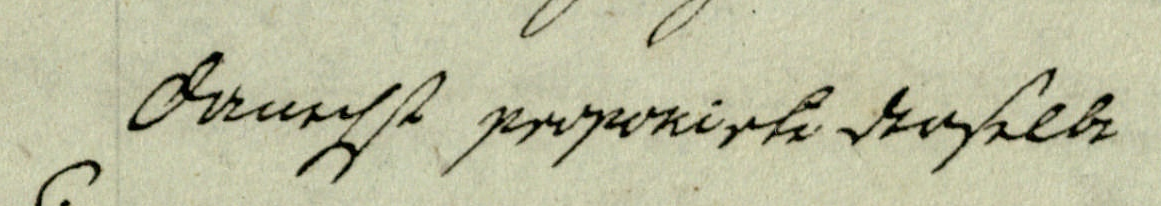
Danechst proponirte derselbe
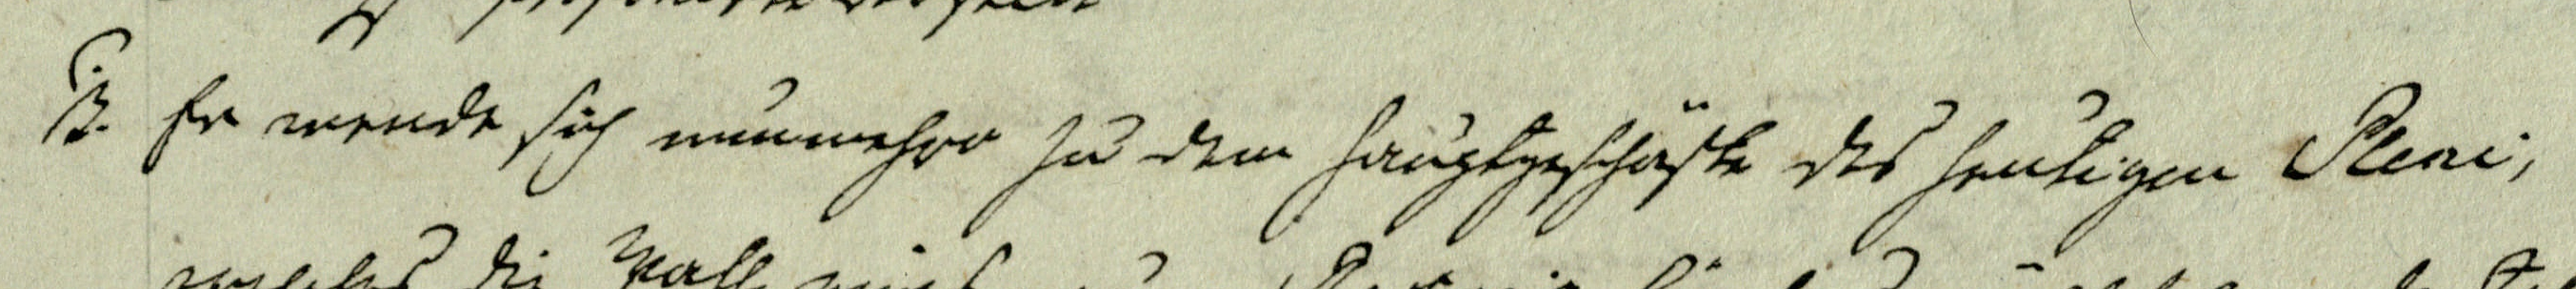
3. Er wende sich nunmehro zu dem Hauptgeschäfte des heutigen Pleni,
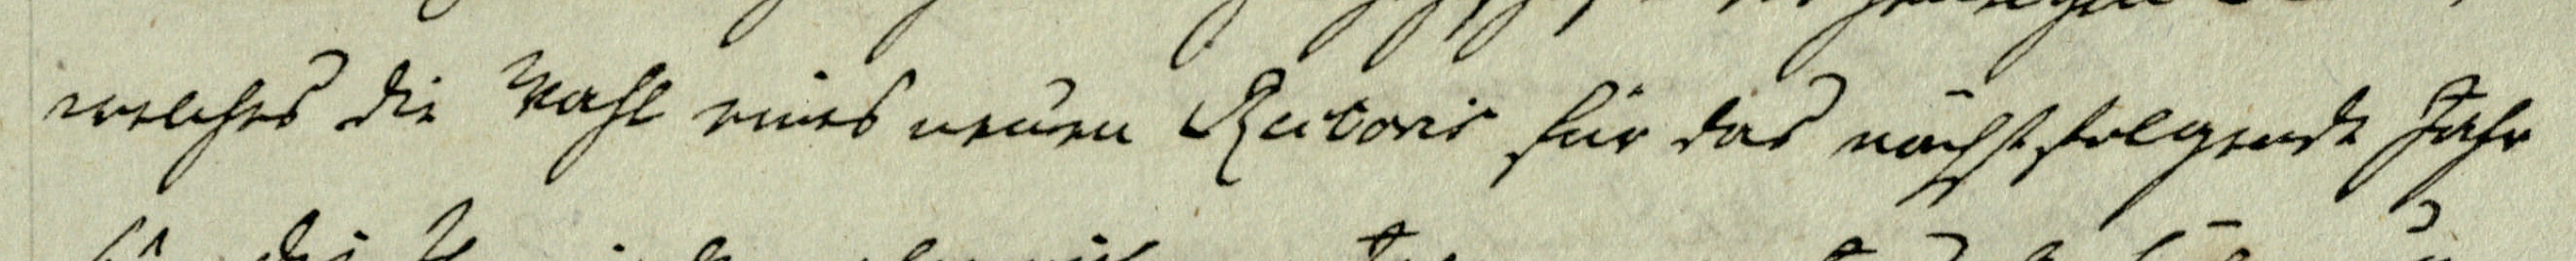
welches die Wahl eines neuen Rectoris für das nächstfolgende Jahr
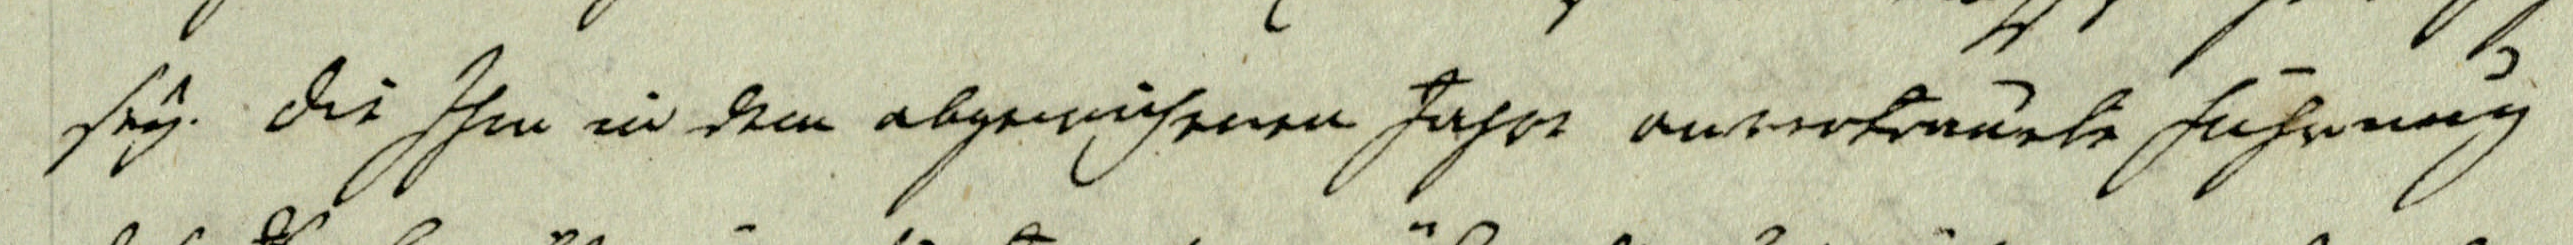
seÿ. Die Ihm in dem abgewichenen Jahre anvertrauete Führung
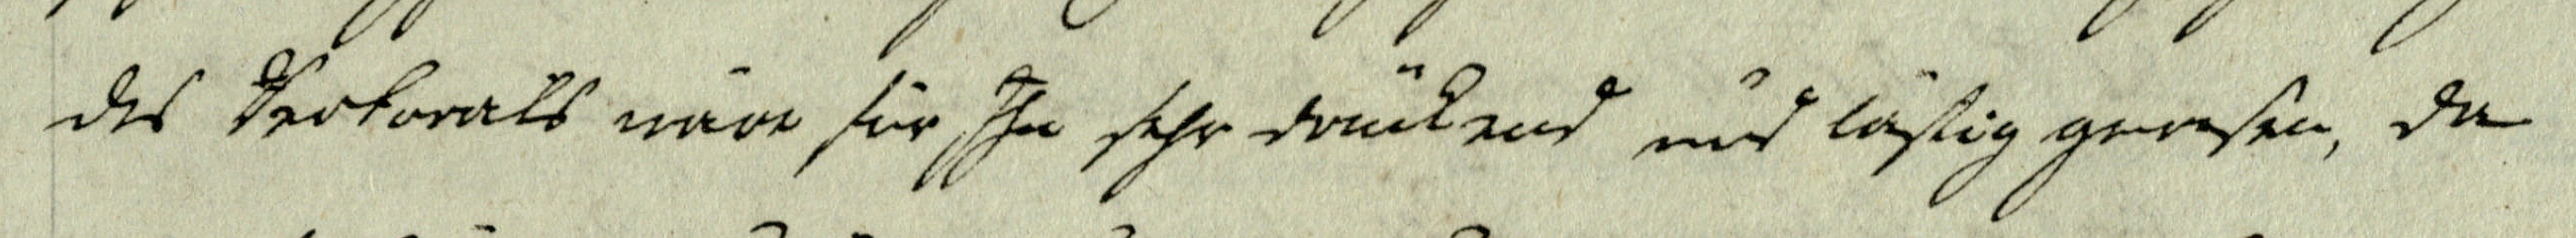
des Rectorats wäre für Ihn sehr drückend und lästig gewesen, da
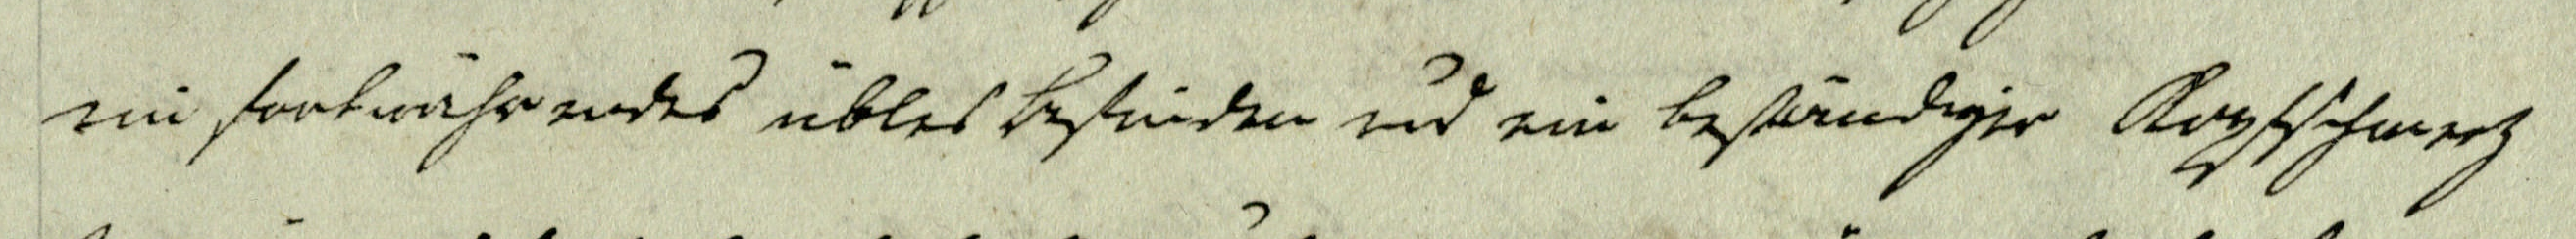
in fortwährendes übles Befinden und ein beständiger Kopfschmerz
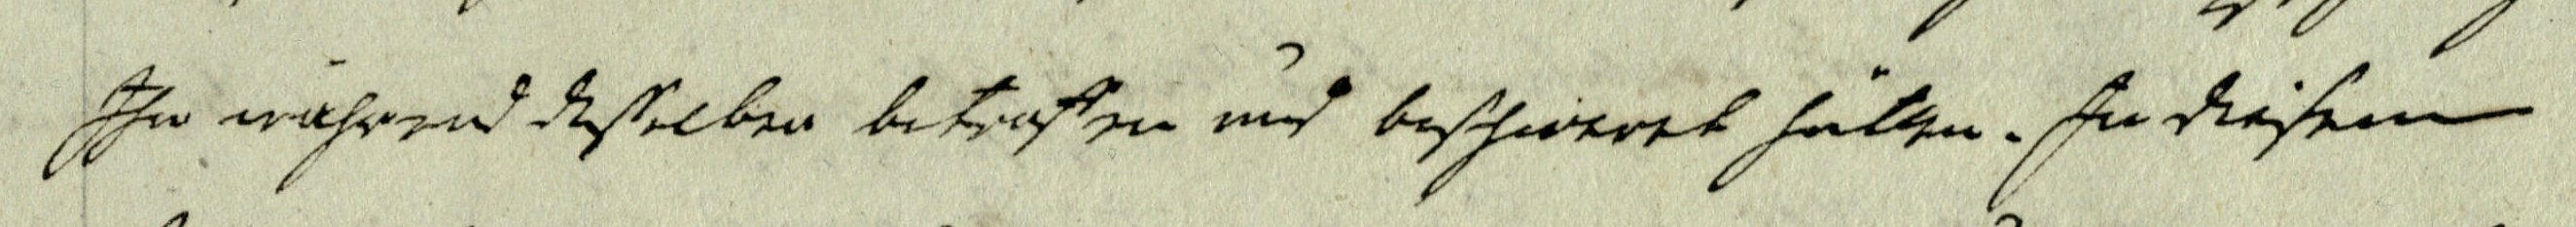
Ihn während desselben betroffen und beschweret hätten. In diesem
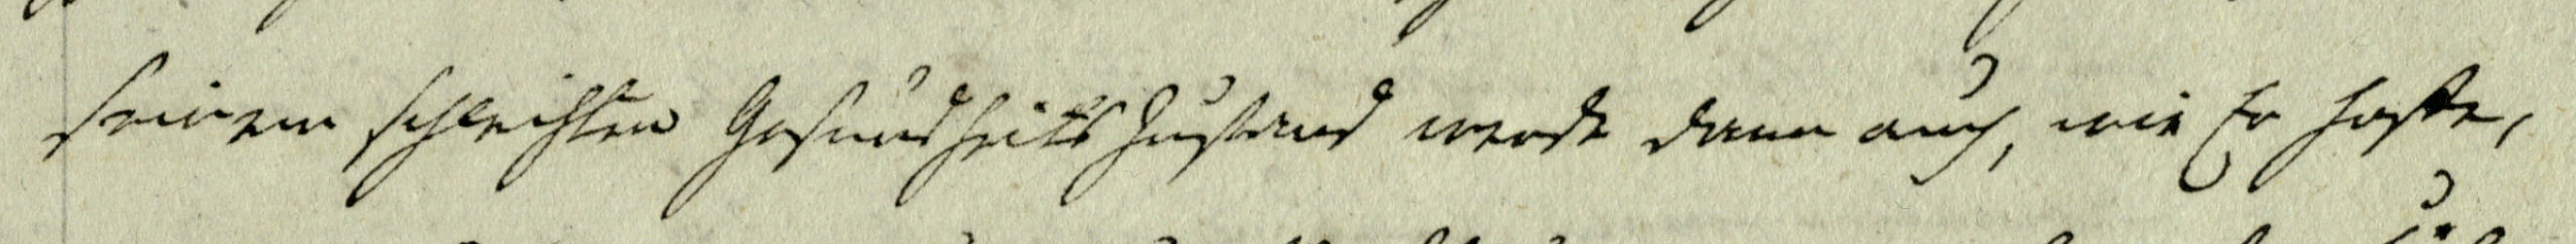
seinem schlechten Gesundheitszustand werde dann auch, wie Er hofte,
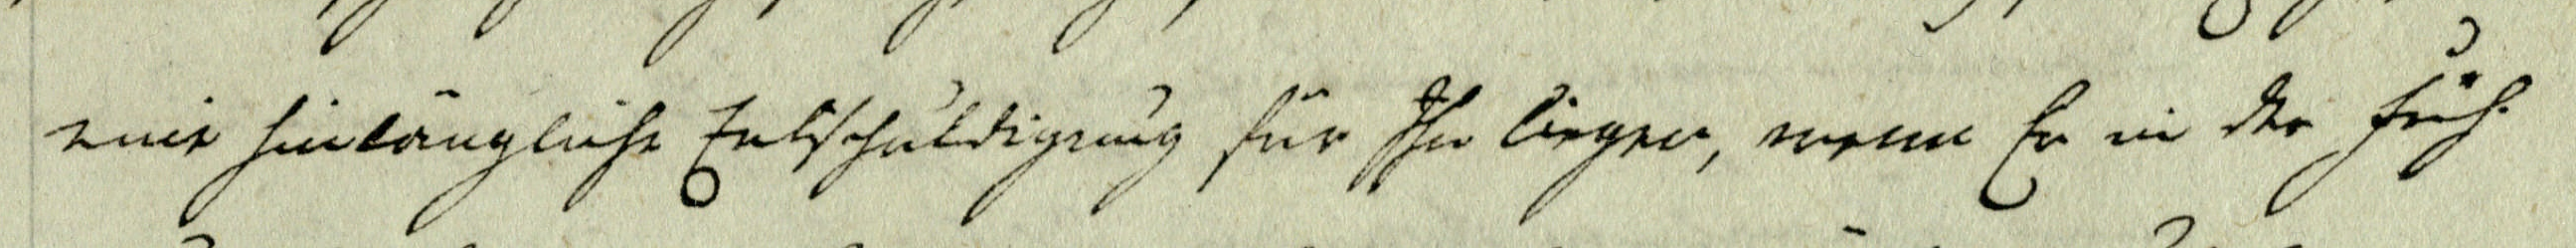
ein hinlängliche Entschuldigung für Ihn liegen, wenn Er in der Füh¬
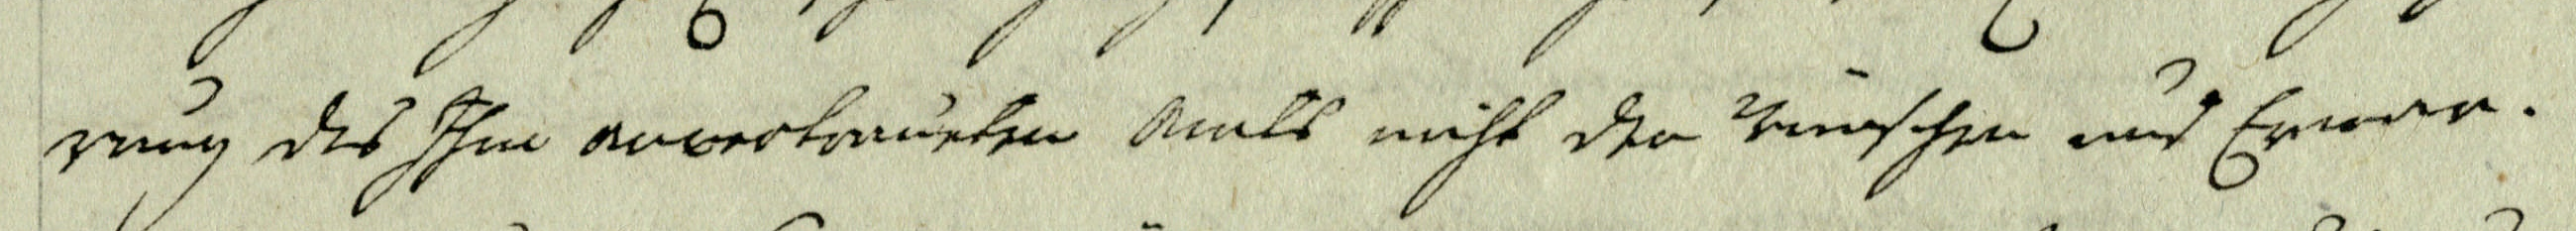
rung des Ihm anvertraueten Amts nicht den Wünschen und Erwar¬
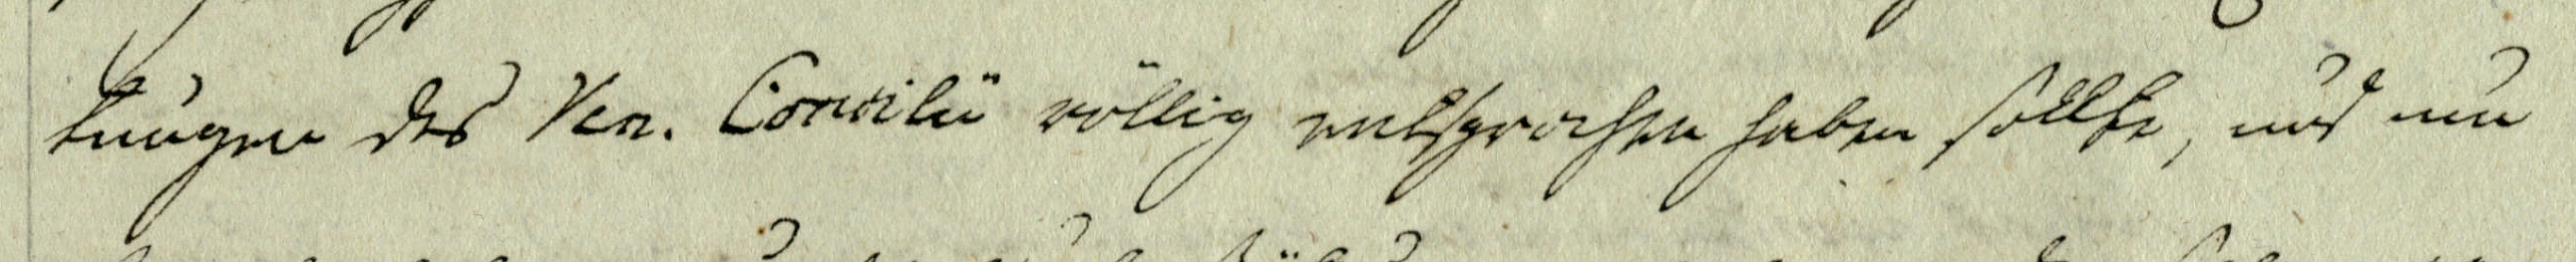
tungen des Ven. Concilii völlig entsprochen haben sollte, und um
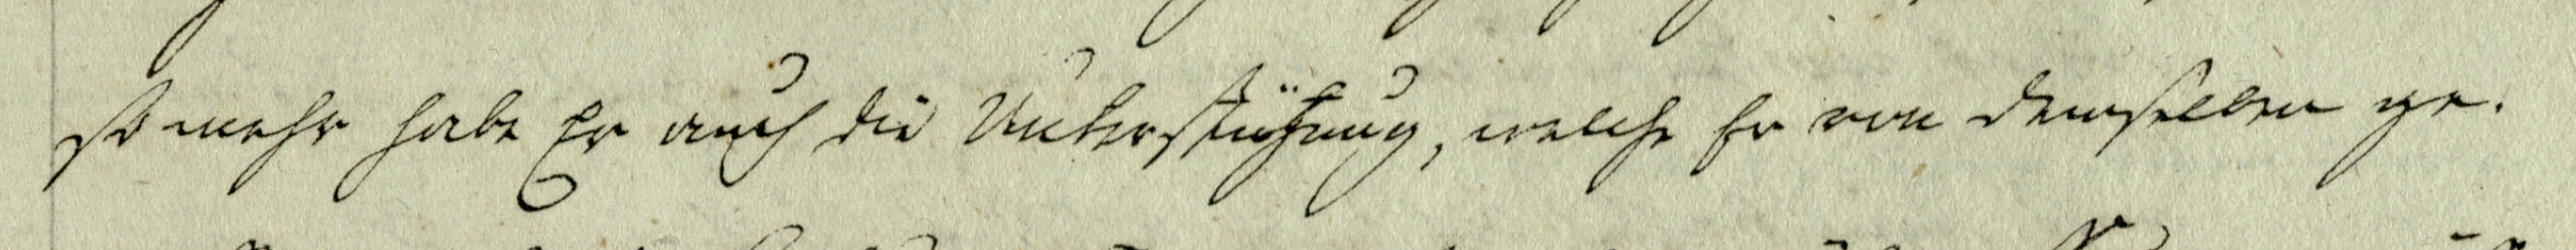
so mehr habe Er auch die Unterstützung, welche Er von demselben ge¬
